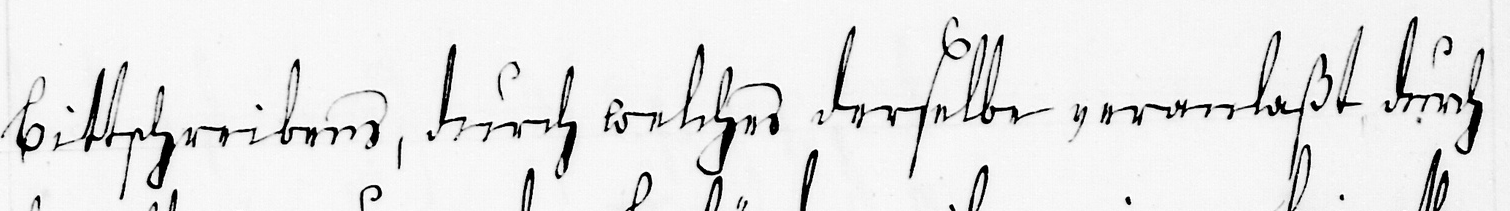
Bittschreibens, durch welches derselbe veranlaßt durch
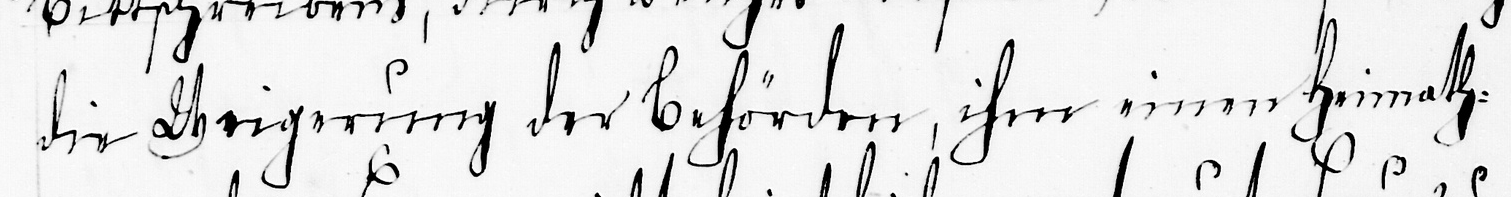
die Weigerung der Behörde, ihm einen Heimath¬
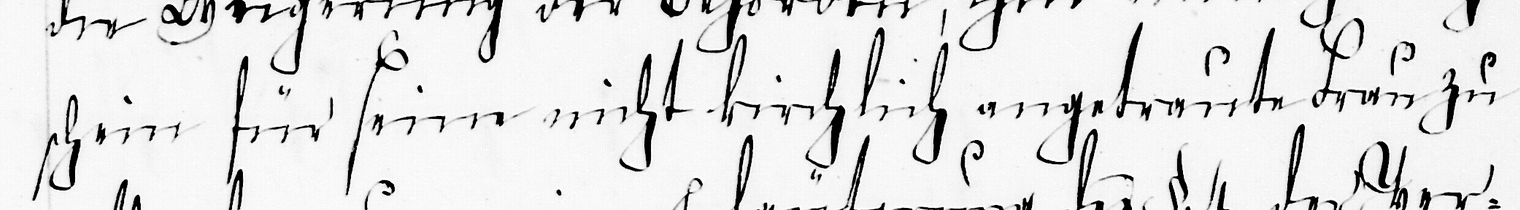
schein für seine nicht kirchlich angetraute Frau zu
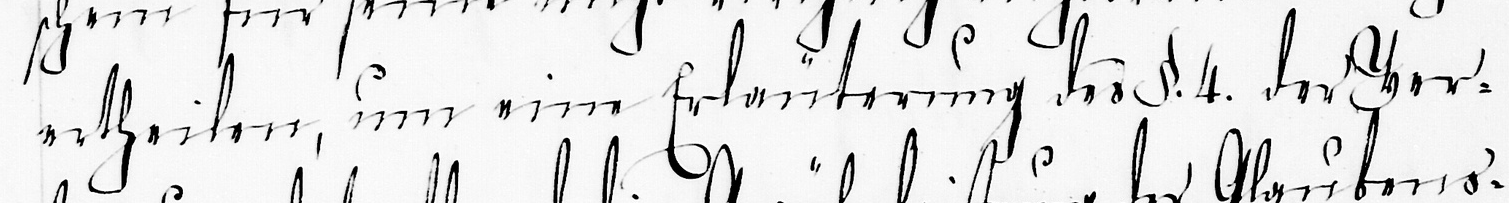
ertheilen, um eine Erläuterung des §. 4. der Ver¬
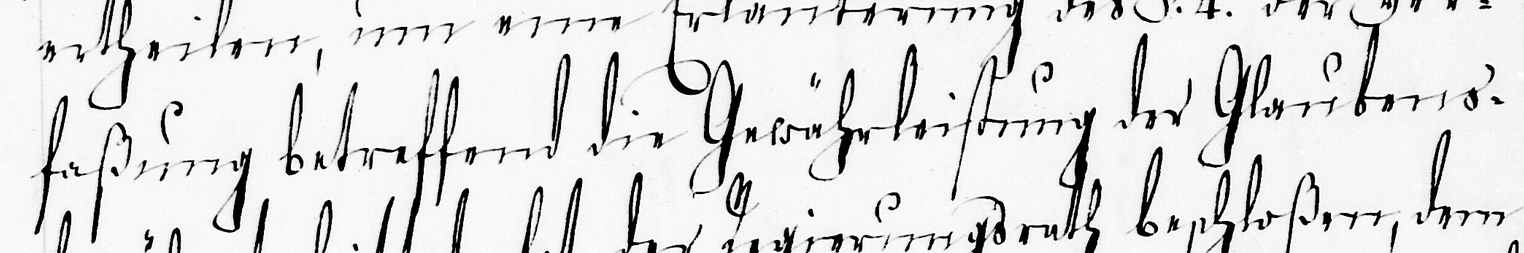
faßung betreffend die Gewährleisung der Glaubens¬
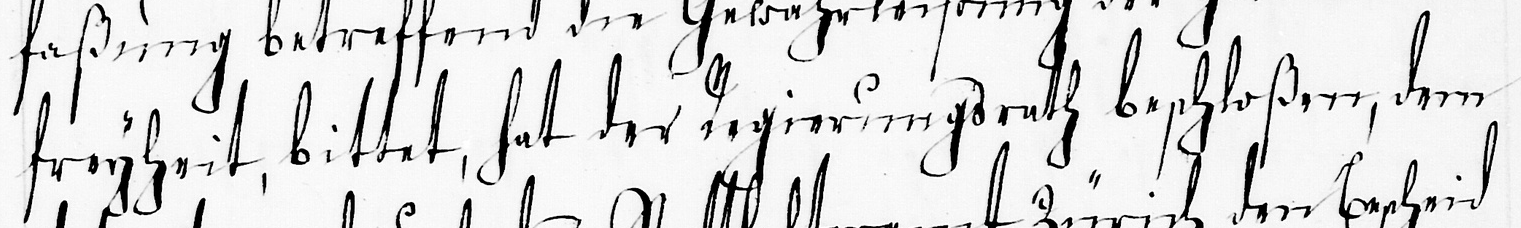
freyheit, bittet, hat der Regierungsrath beschloßen, dem
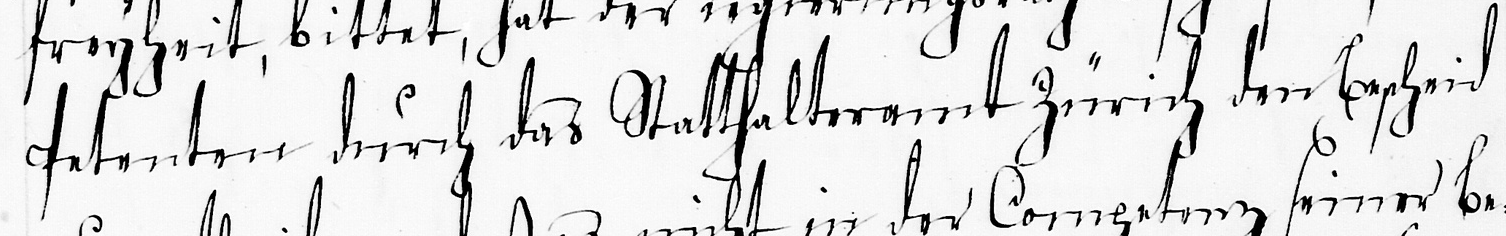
Petenten durch das Statthalteramt Zürich den Bescheid
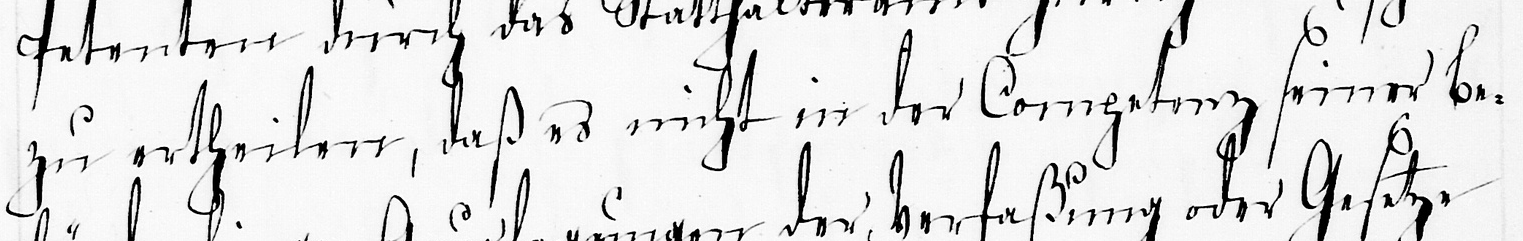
zu ertheilen, daß es nicht in der Competenz seiner Be¬
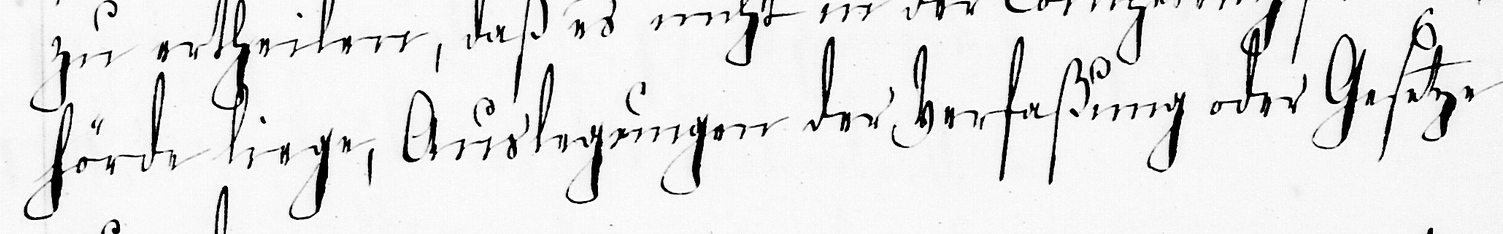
hörde liege, Auslegungen der Verfaßung oder Gesetze
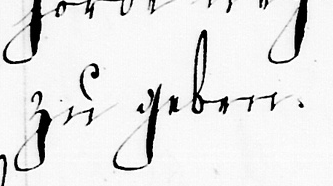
zu geben.
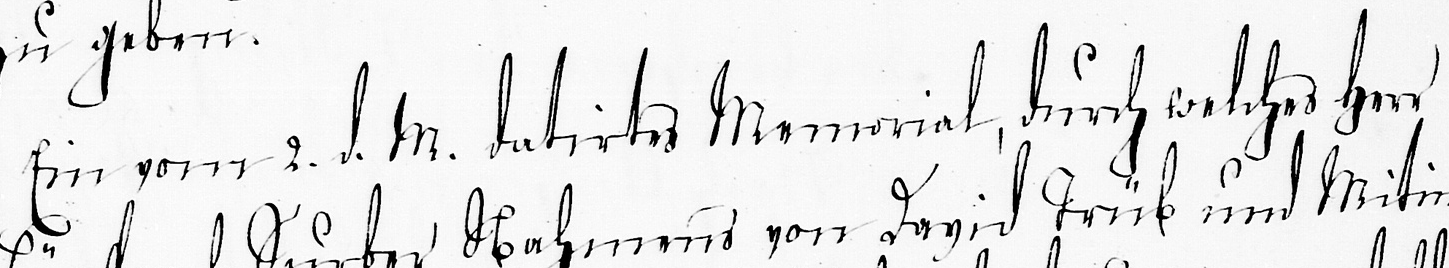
Ein vom 2. d. M. datirtes Memorial, durch welches He¬
